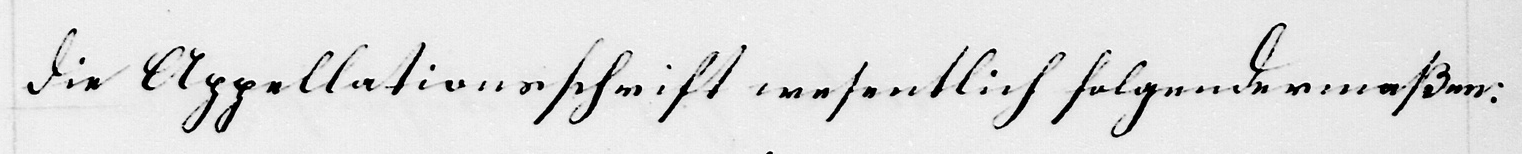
die Appellationsschrift wesentlich folgendermaßen:
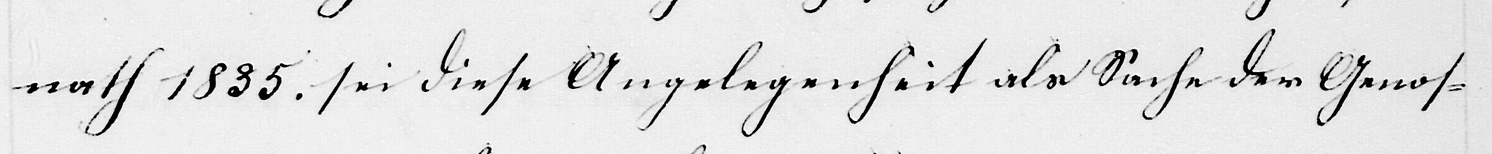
nath 1835. sei diese Angelegenheit als Sache der Genos¬
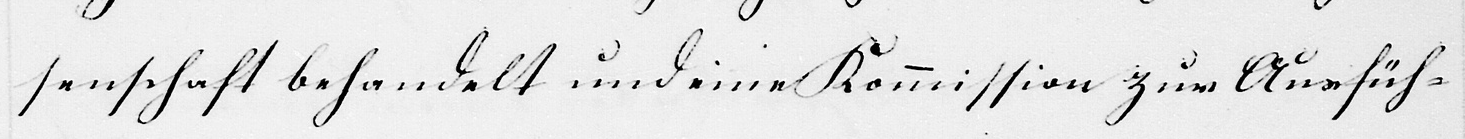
senschaft behandelt und eine Kommission zur Ausfüh¬
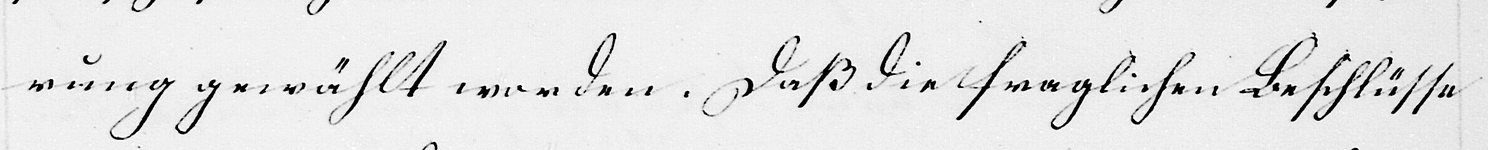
rung gewählt worden. Daß die fraglichen Beschlüsse
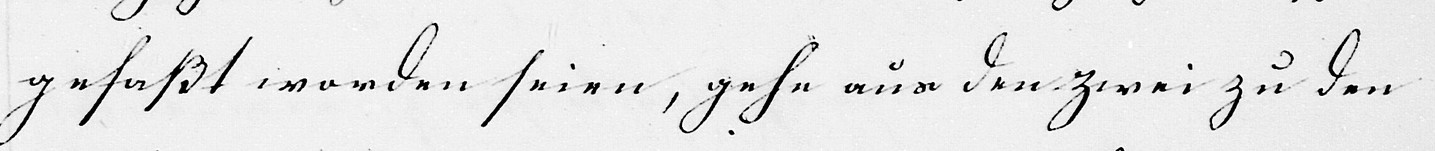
gefaßt worden seien, gehe aus den zwei zu den
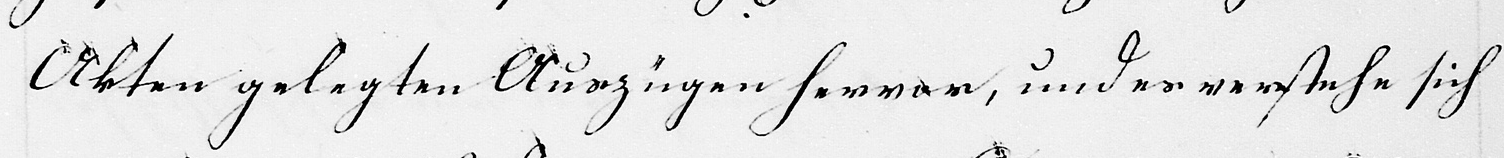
Akten gelegten Auszügen hervor, und es verstehe sich
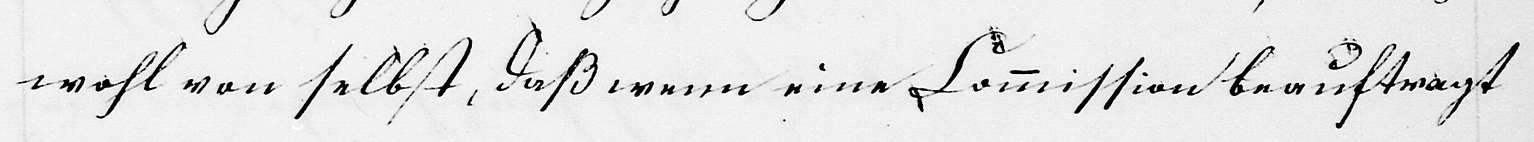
wohl von selbst, daß wenn eine Commission beauftragt
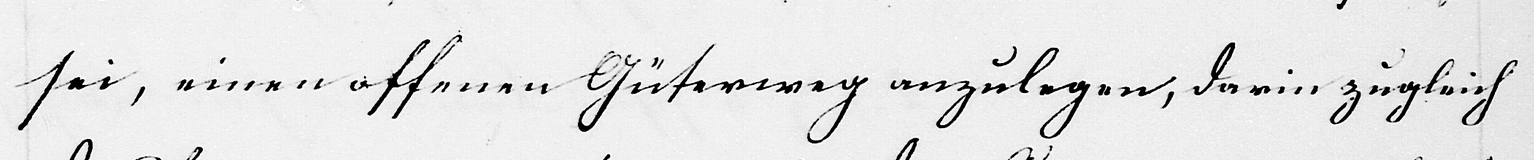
sei, einen offenen Güterweg anzulegen, darin zugleich
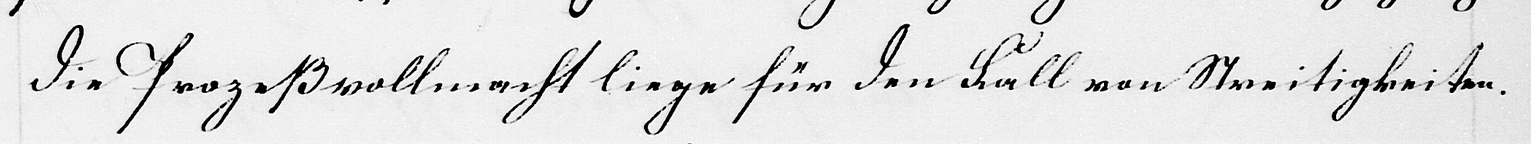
die Prozeßvollmacht liege für den Fall von Streitigkeiten.
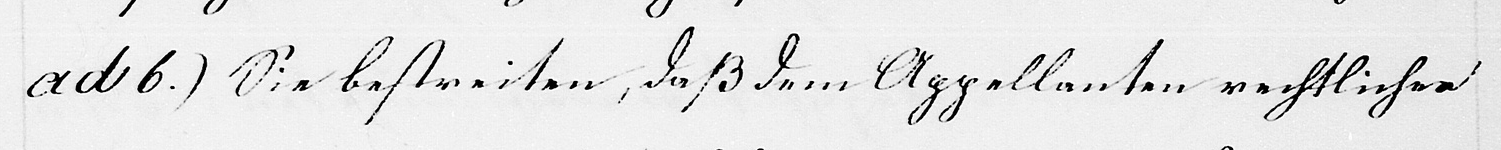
ad b.) Sie bestreiten, daß dem Appellanten rechtliches
